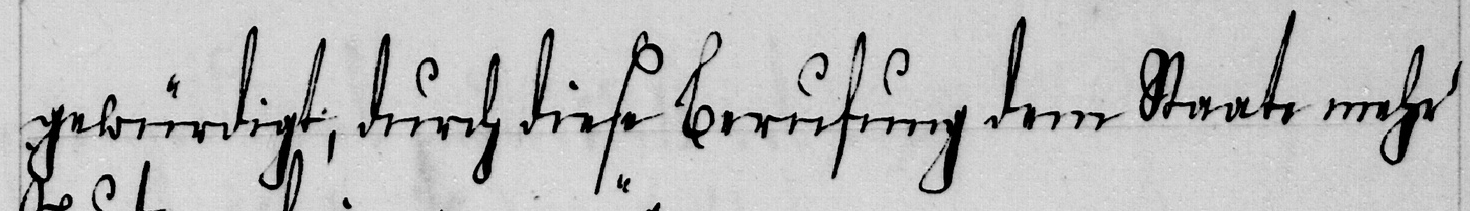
gewürdigt, durch diese Berufung dem Staate mehr
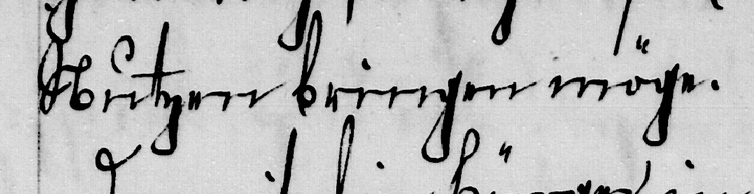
Nutzen bringen möge.
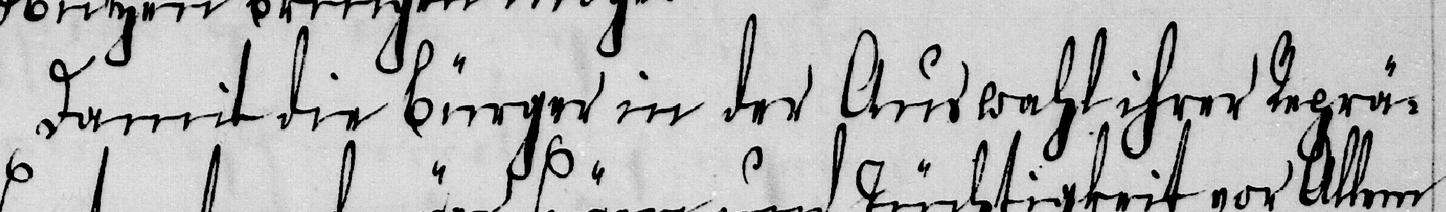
Damit die Bürger in der Auswahl ihrer Reprä¬
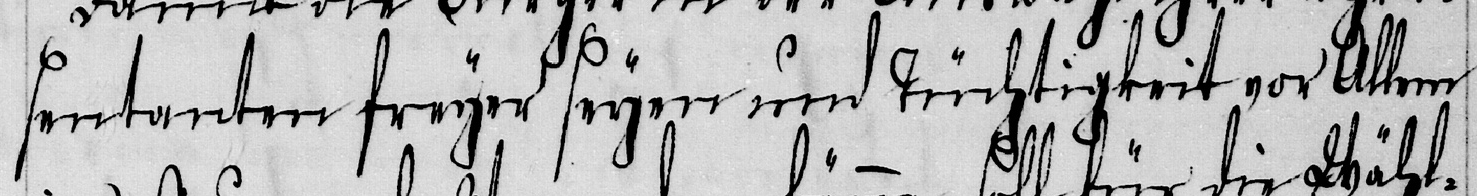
sentanten freyer seyen und Tüchtigkeit vor Allem
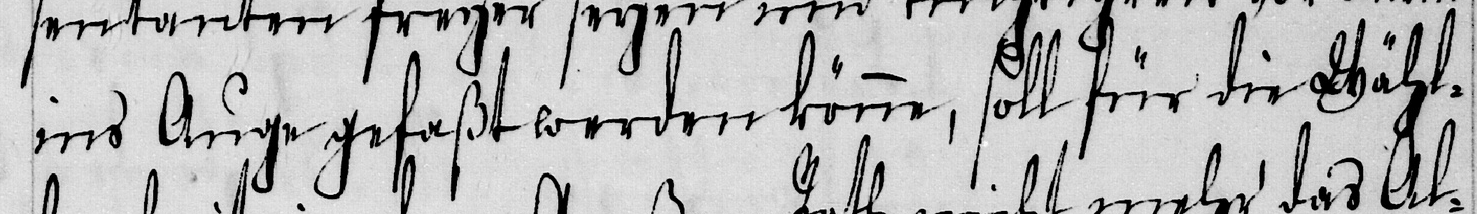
ins Auge gefaßt werden könne, soll für die Wähl¬
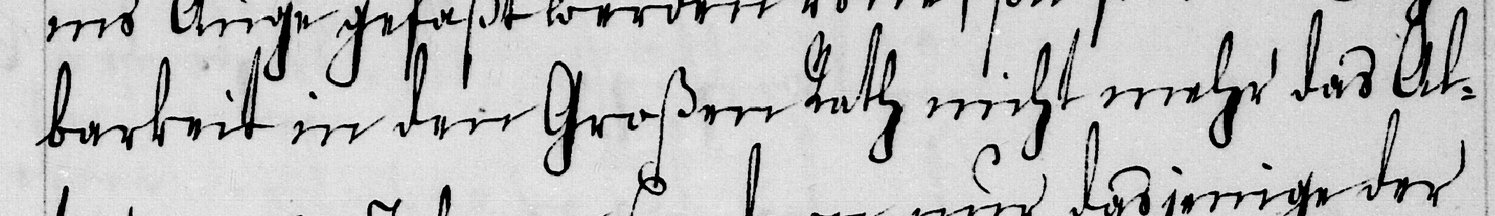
barkeit in den Großen Rath nicht mehr das Al¬
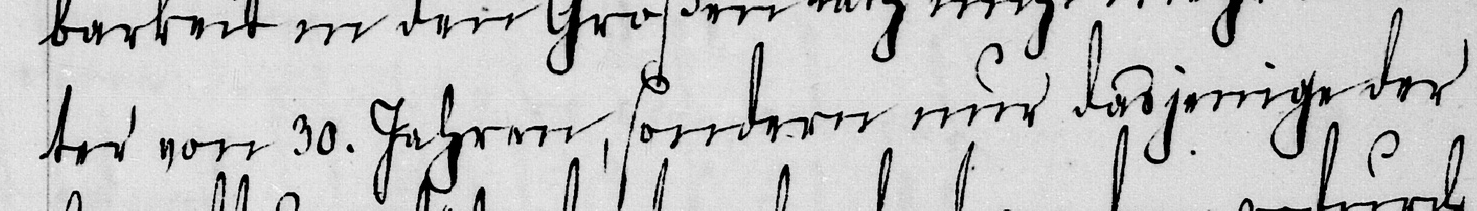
ter von 30. Jahren, sondern nur dasjenige der
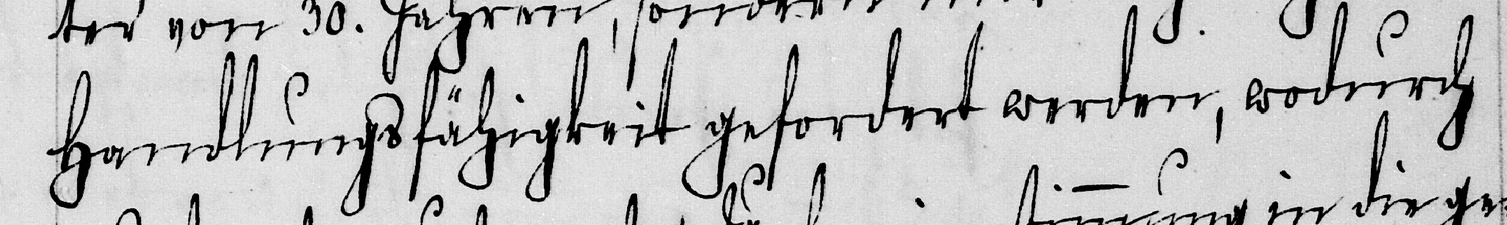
Handlungsfähigkeit gefordert werden, wodurch
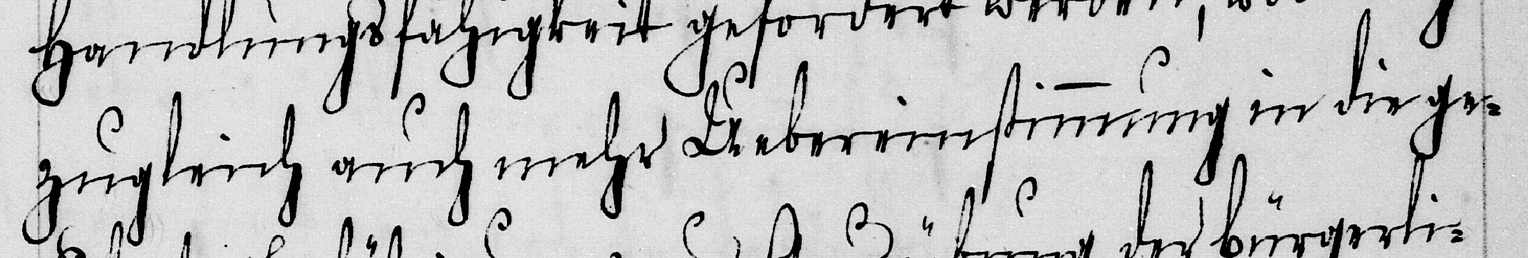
zugleich auch mehr Uebereinstimmung in die ge¬
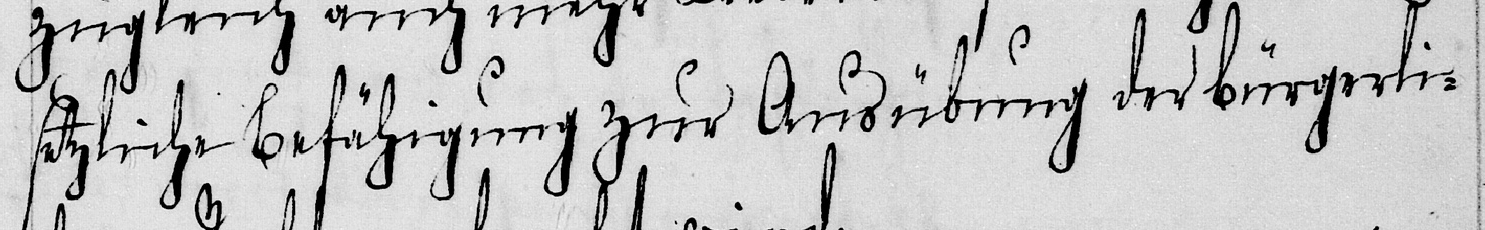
setzliche Befähigung zur Ausübung der bürgerli¬
